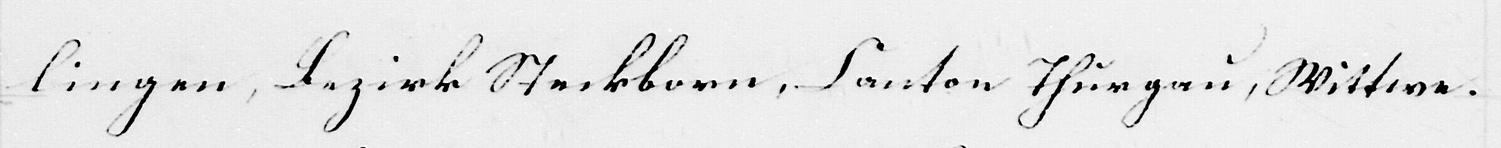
lingen, Bezirk Steckborn, Canton Thurgau, Wittwe.
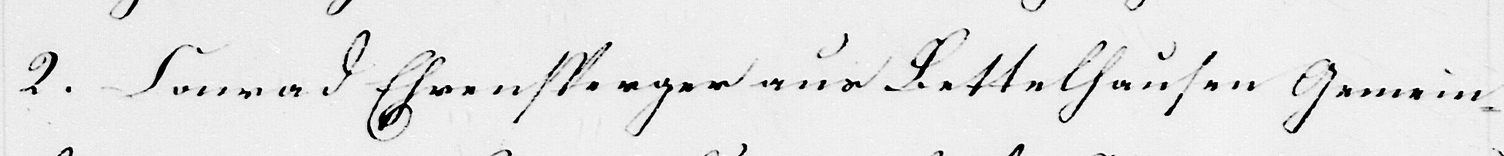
2. Conrad Ehrensperger aus Bettelhausen Gemein¬
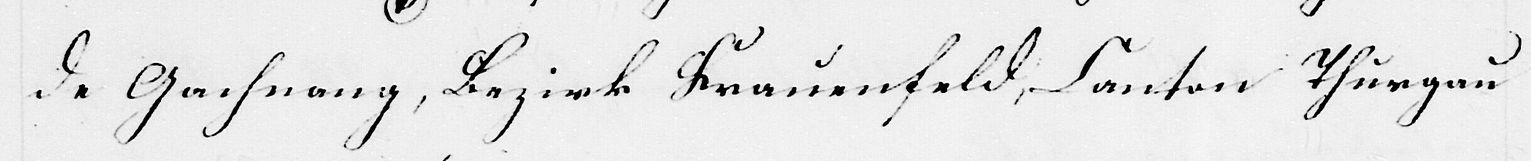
de Gachnang, Bezirk Frauenfeld, Canton Thurgau
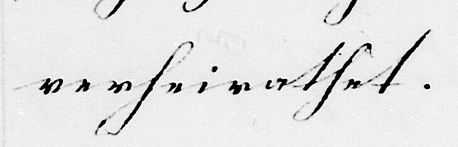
verheirathet.
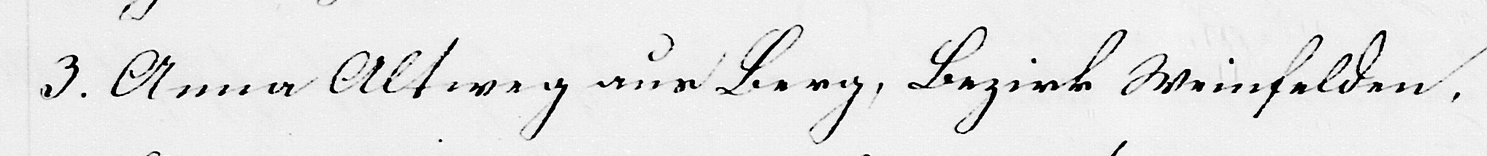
3. Anna Altweg aus Berg, Bezirk Weinfelden,
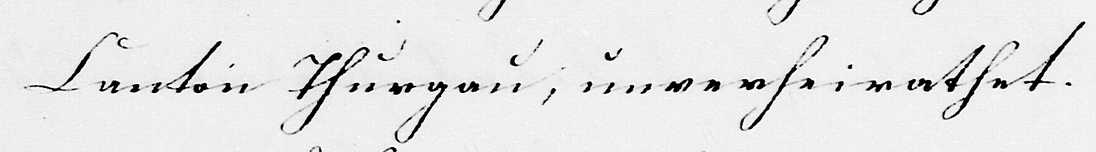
Canton Thurgau, unverheirathet.
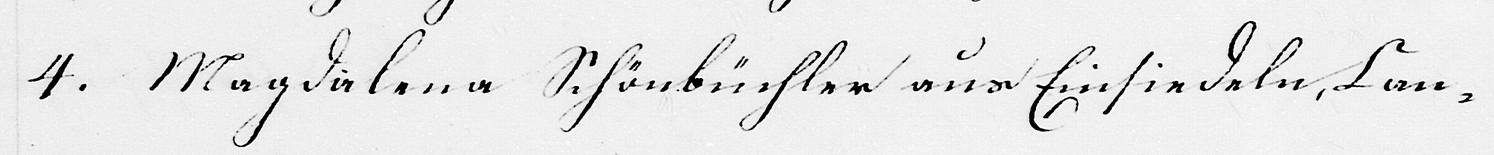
4. Magdalena Schönbüchler aus Einsiedeln, Can¬
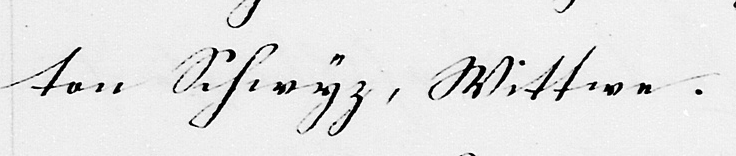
ton Schwyz, Wittwe.
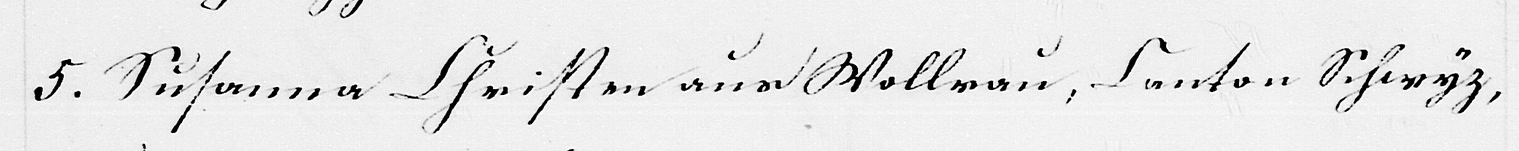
5. Susanna Christen aus Wollrau, Canton Schwyz,
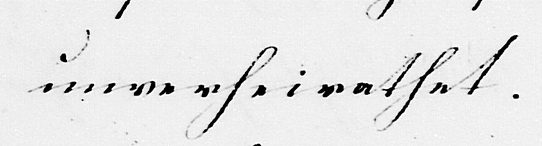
unverheirathet.
